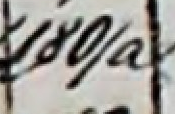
180/a
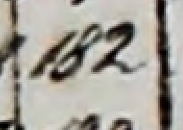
182
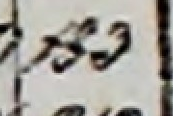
183
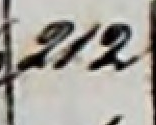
212
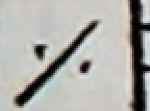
./.
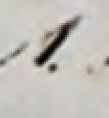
1
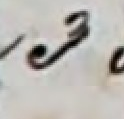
3
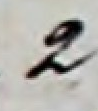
2
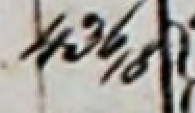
436,8
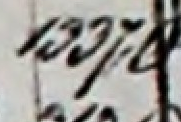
1337,6
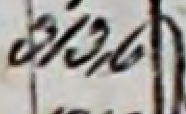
313,6
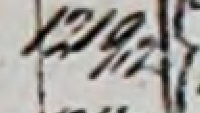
1219,2
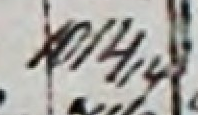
1014,4
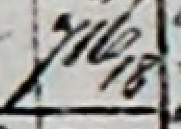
716,8
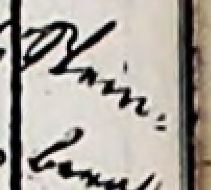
Stein„
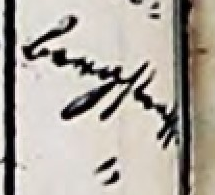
berg???
